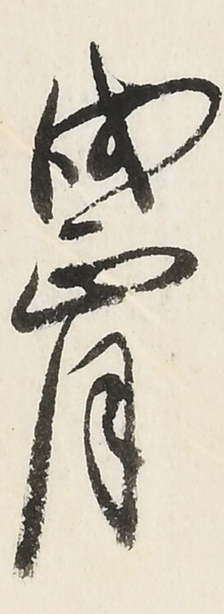戌正月
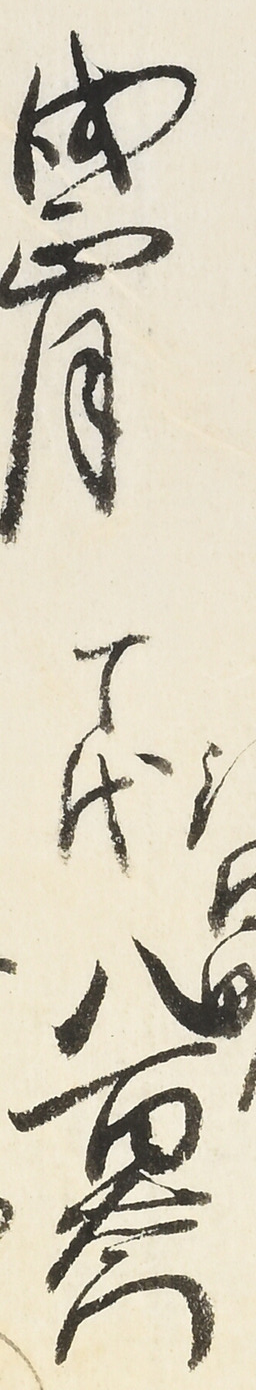戌正月丁代八百右衛門
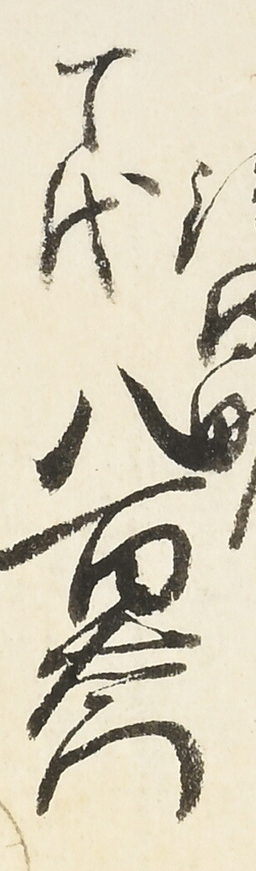丁代伊右衛門
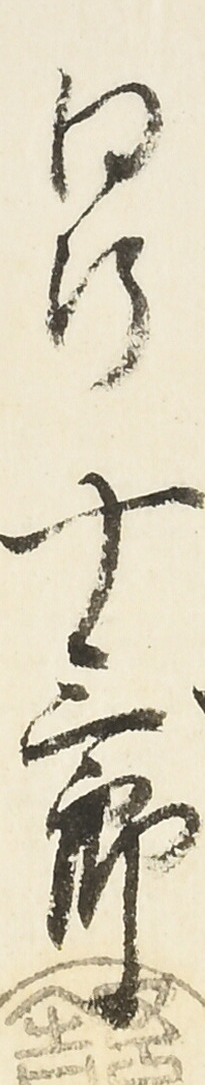同断十三郎
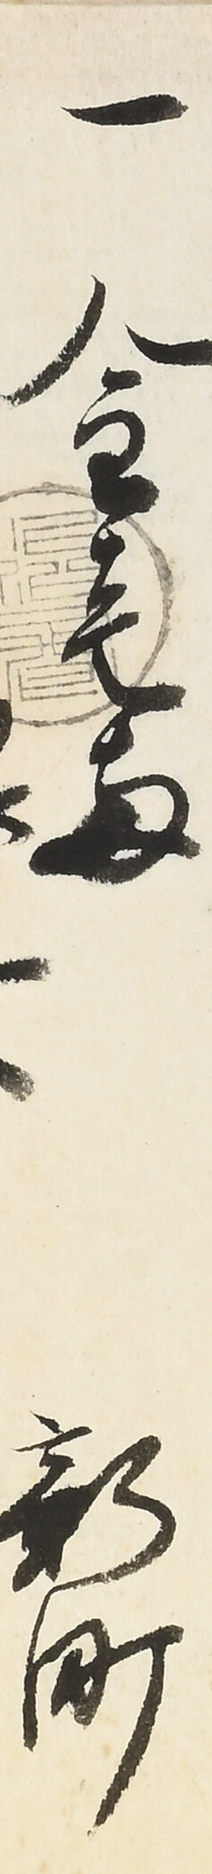一金壱両新町
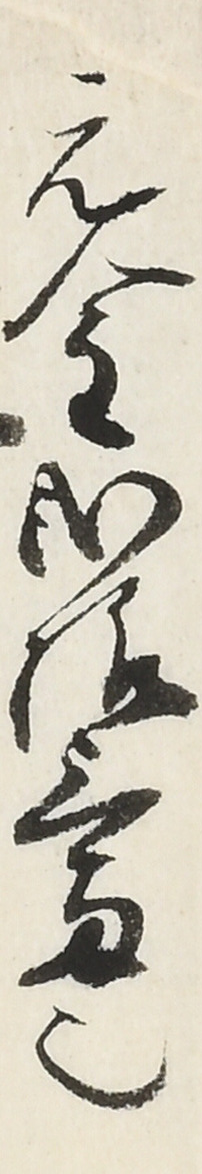元金弐拾三両也
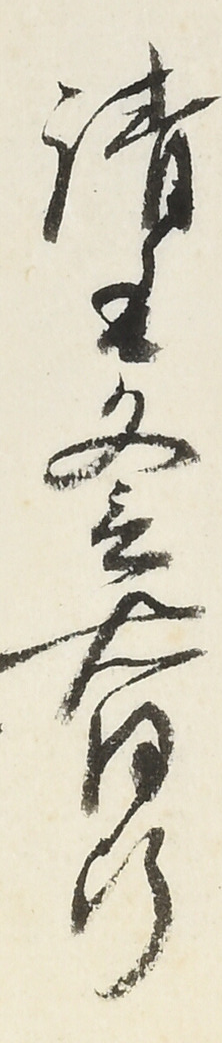請取文言右同断
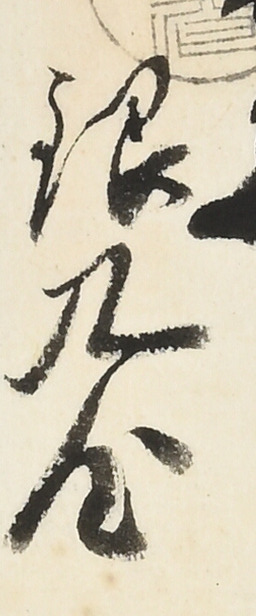銀九匁
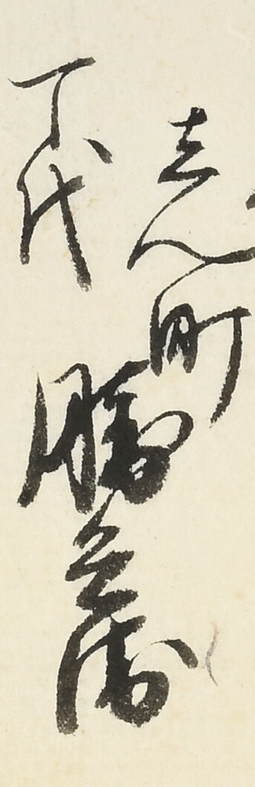丁代勝兵衛
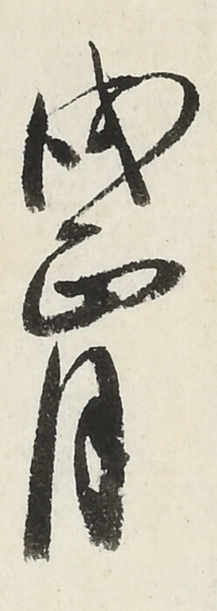戌正月
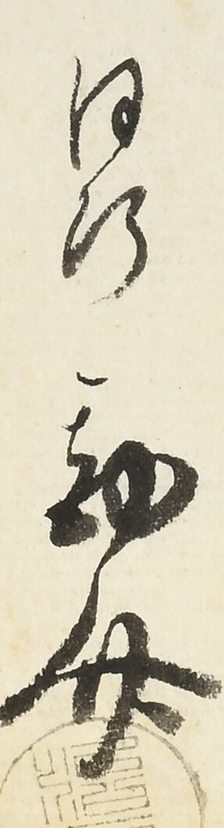同断勘介

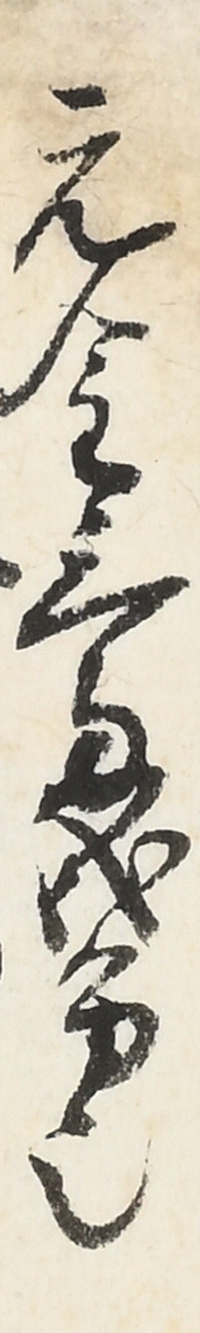元金三両弐分也
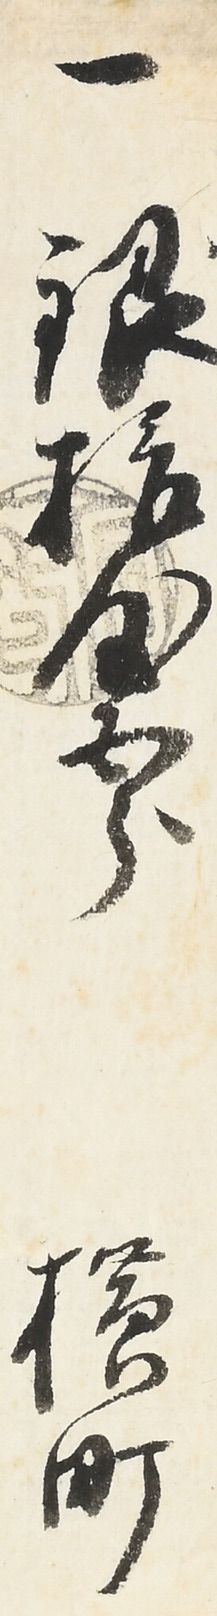一銀拾匁五分横町
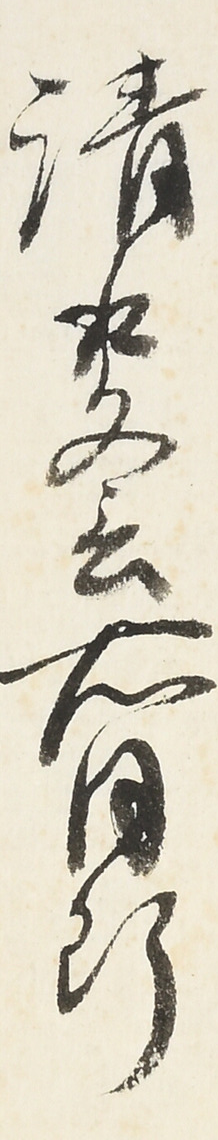請取文言右同断
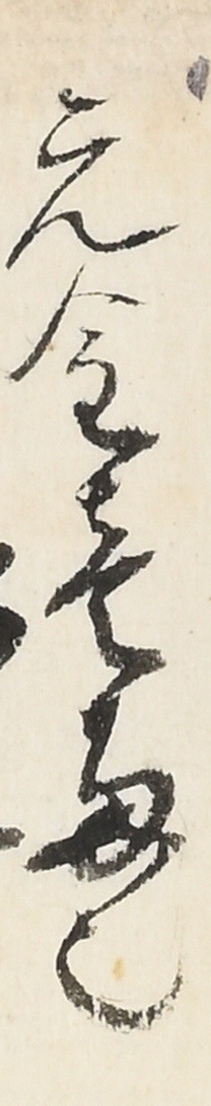元金壱両也
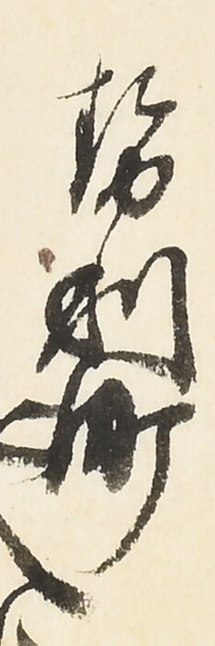勢利町
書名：御才覚金御利足割渡扣帳
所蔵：伊那市立高遠町図書館・合同会社AMANE
